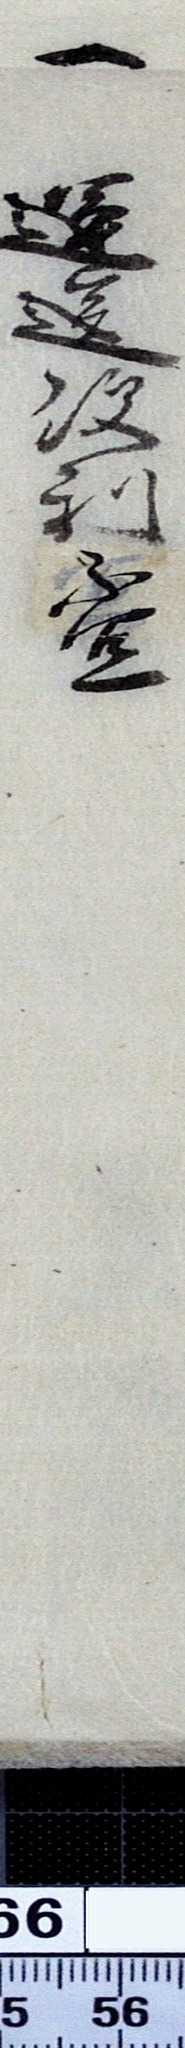一運送便利不宜
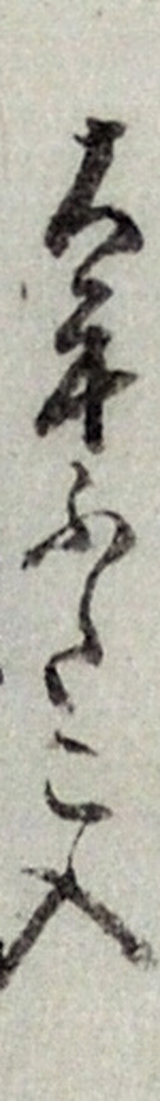大平ふたこ入
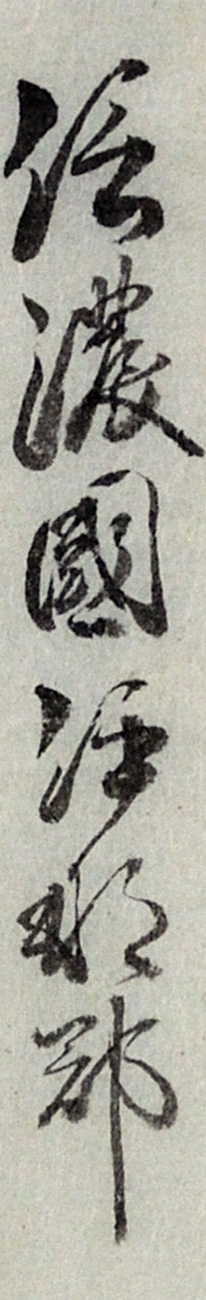信濃国伊那郡
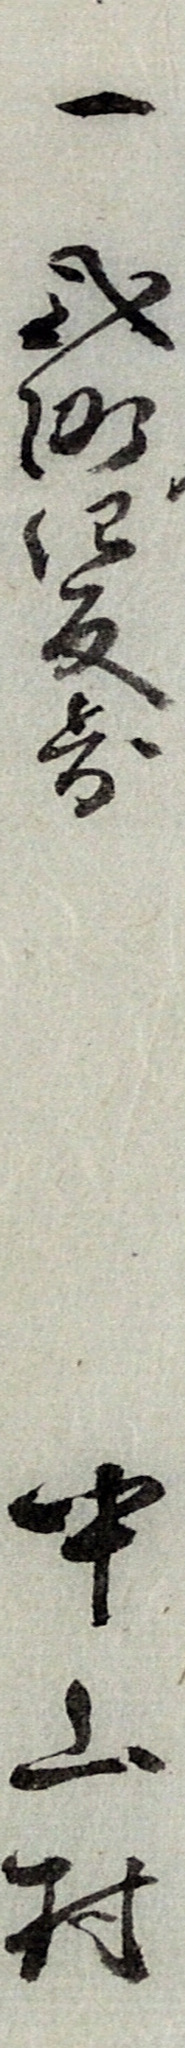一弐町四反歩中山村
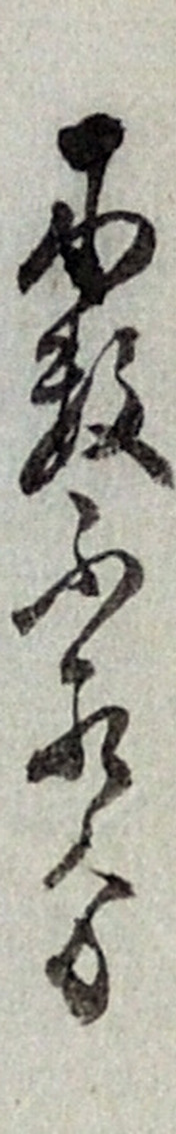木数不相分
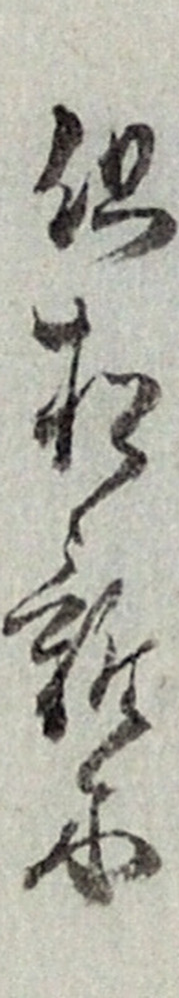但松雑木
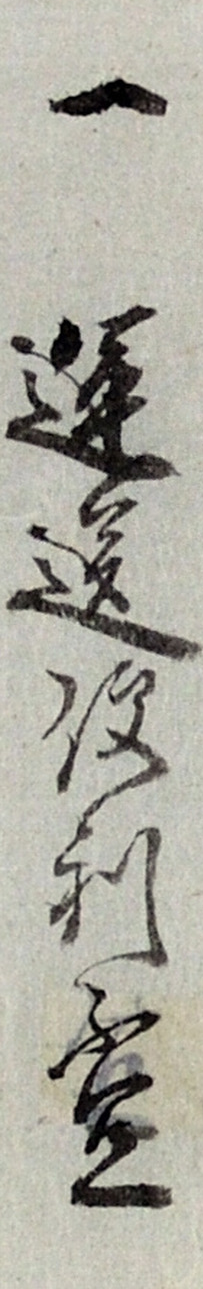一運送便利不宜

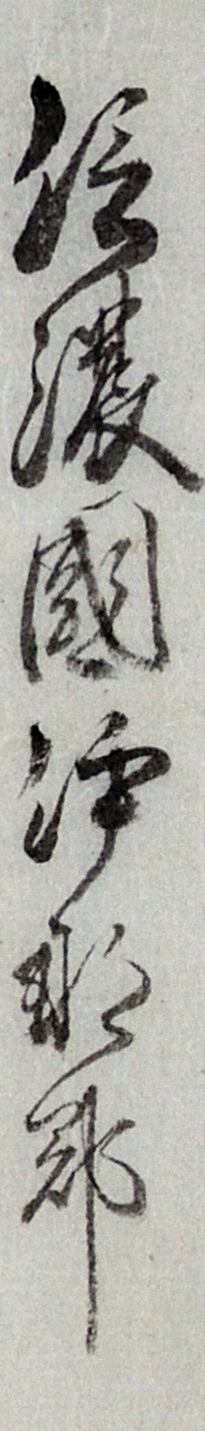信濃国伊那郡
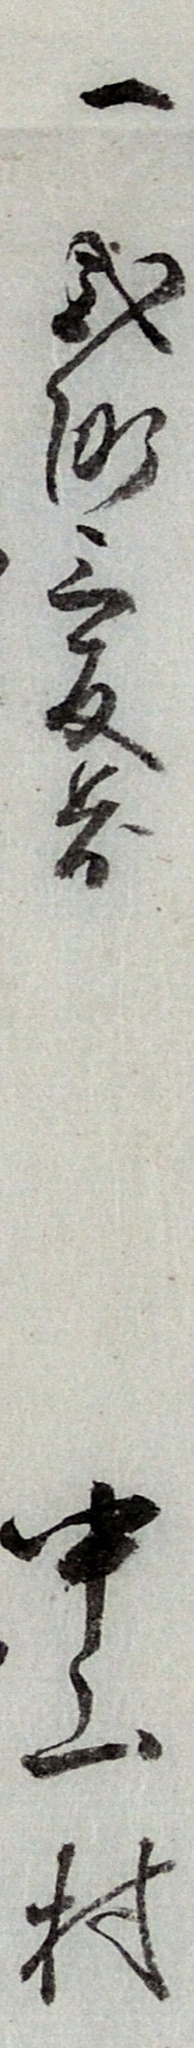一弐町三反歩中山村
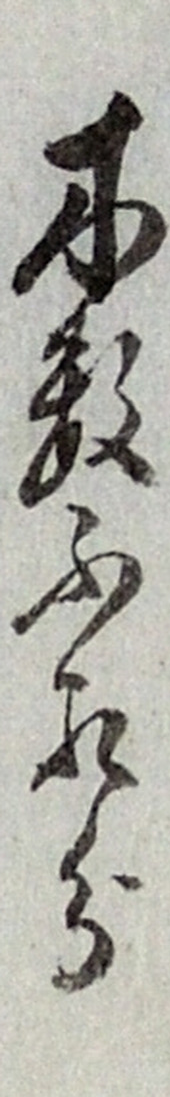木数不相分
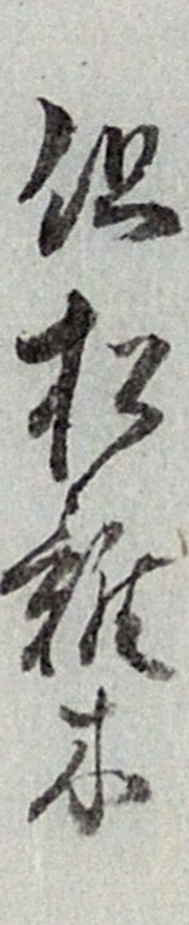但松雑木
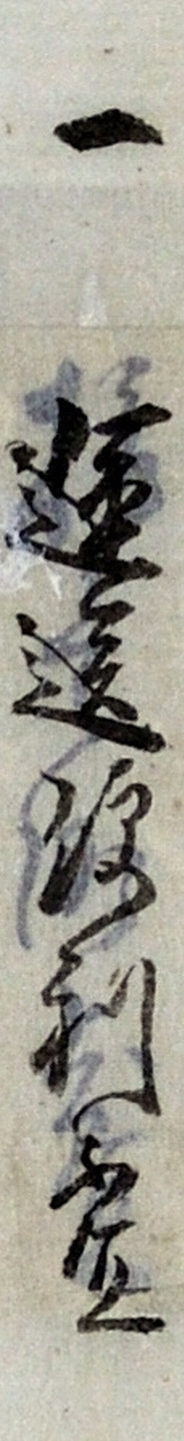一運送便利不宜
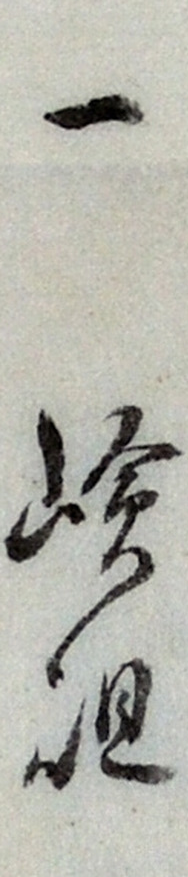一嶮岨
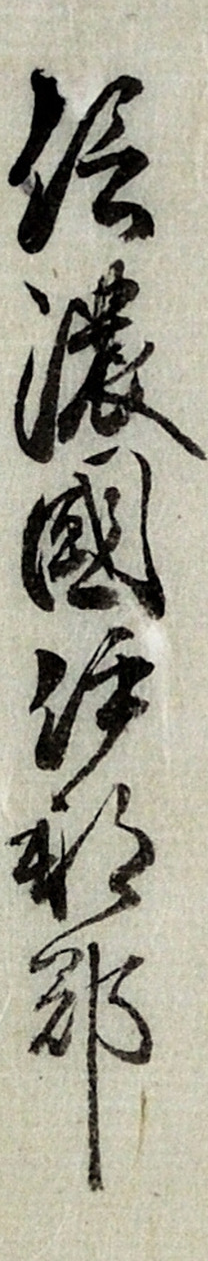信濃国伊那郡
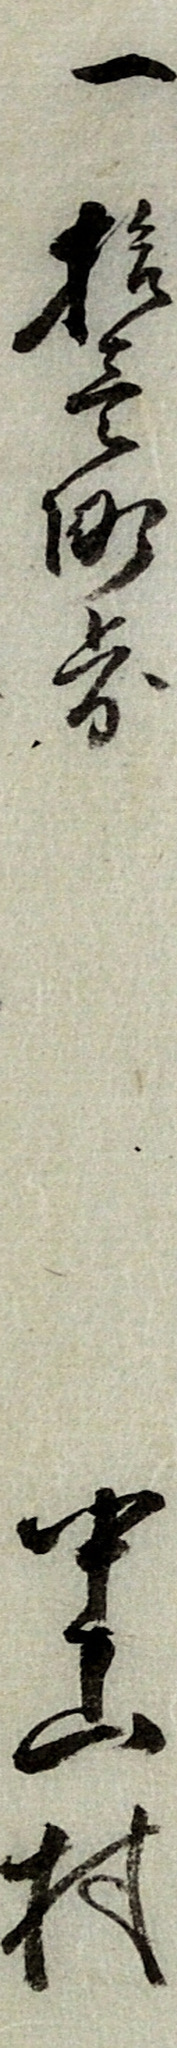一拾壱町歩中山村
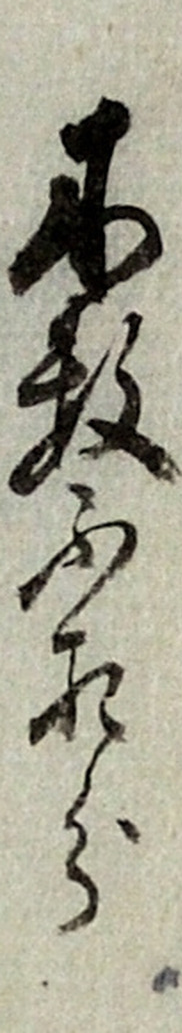木数不相分
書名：官林反別帳
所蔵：伊那市立高遠町図書館・合同会社AMANE
